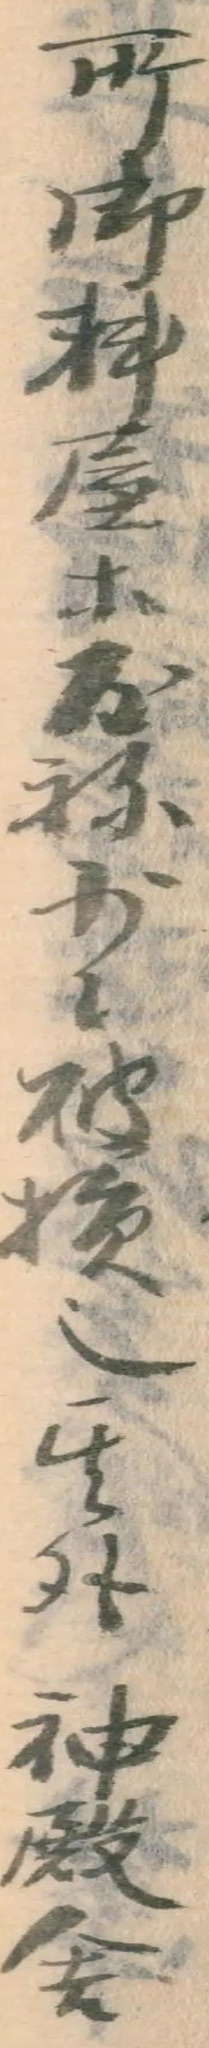所・御料屋等屋ね少々破損也、其外神殿舎
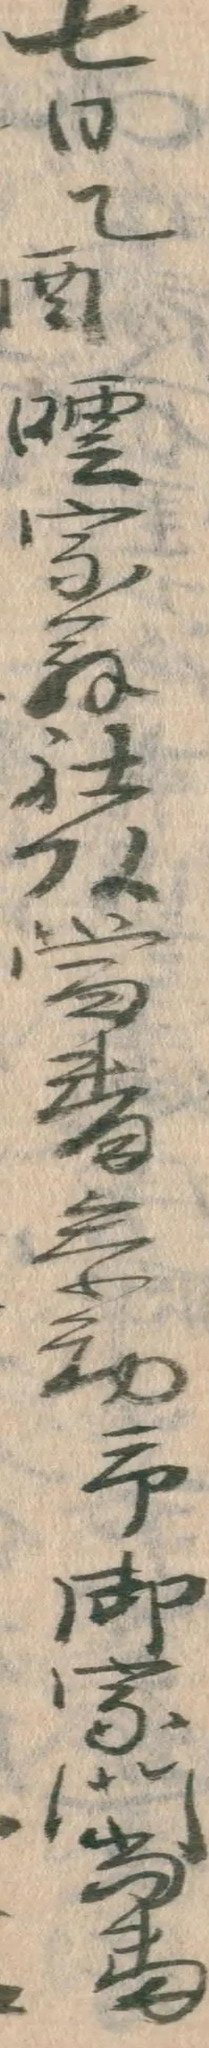七日乙酉曇、家翁社頭當番参勤、予御家門當番
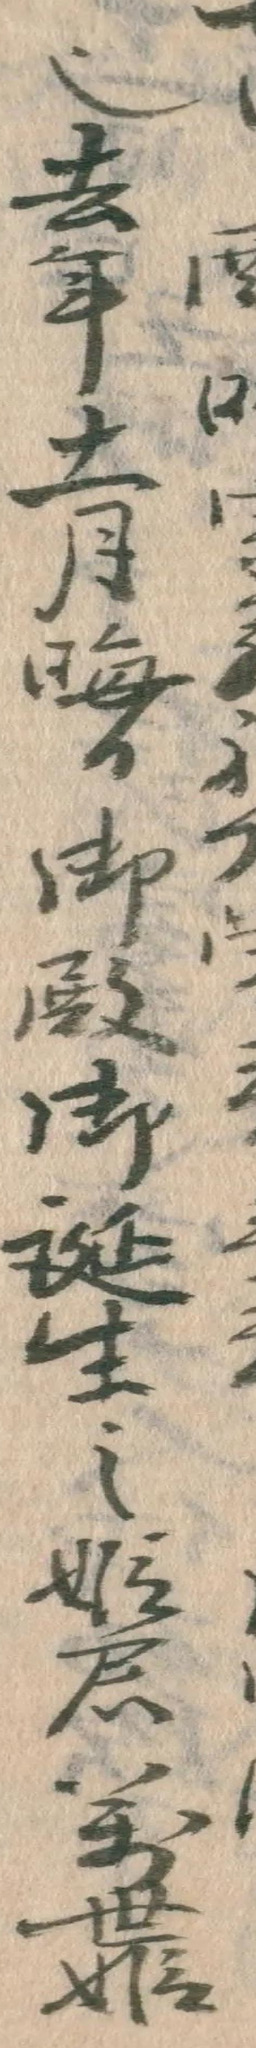也、去年十一月晦日御殿御誕生之姫君、萬世姫
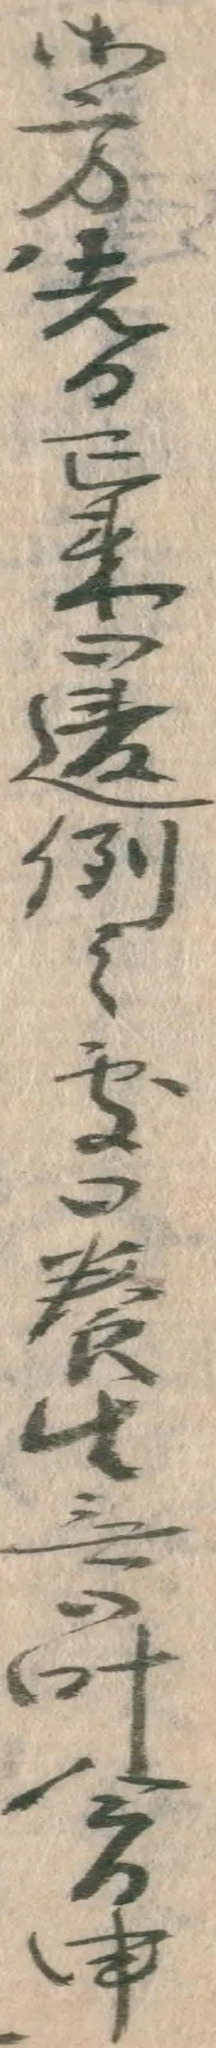御方、先日已来御違例之處、御養生無御叶、今日申
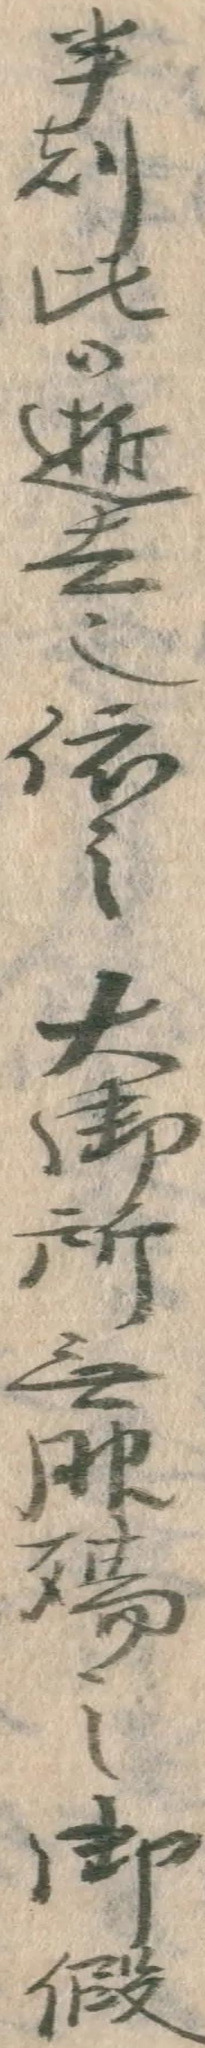半刻比御逝去也、依之大御所無服傷之御假
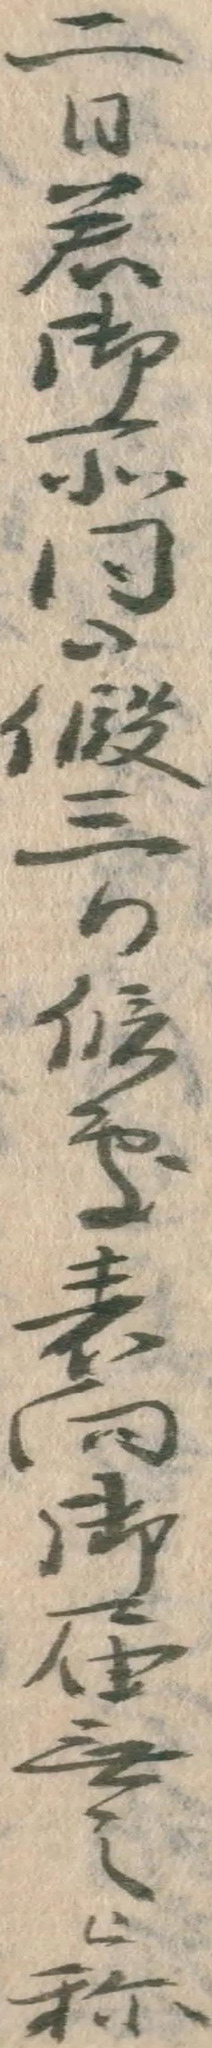二日、若御所同御假三日候處、表向御届無之被称
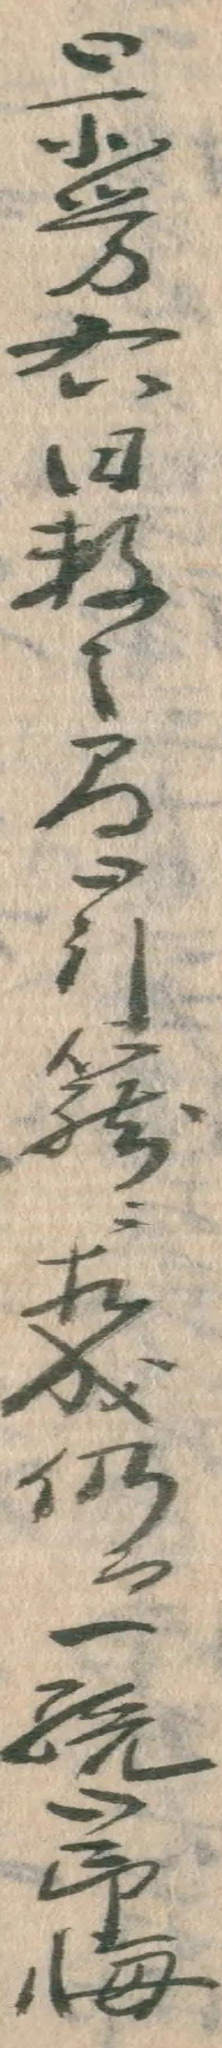御所労、右日数之間御引籠に相成、仍而一統御弔悔
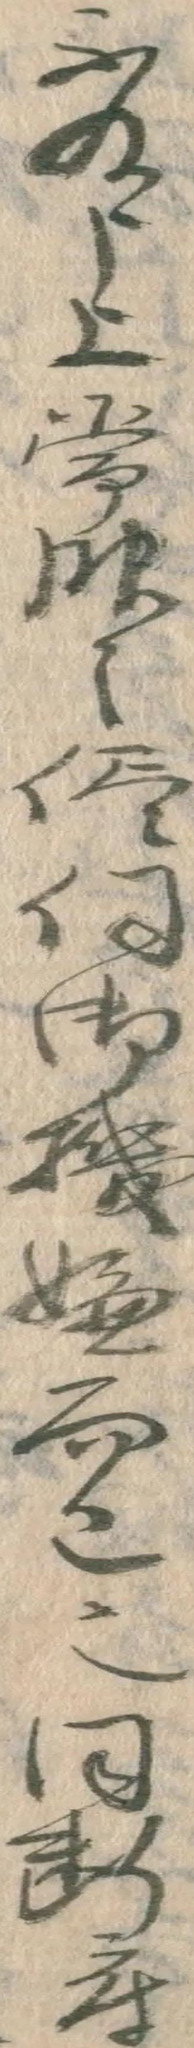不及申上常服之侭伺御機嫌而已也、同断ニ付、
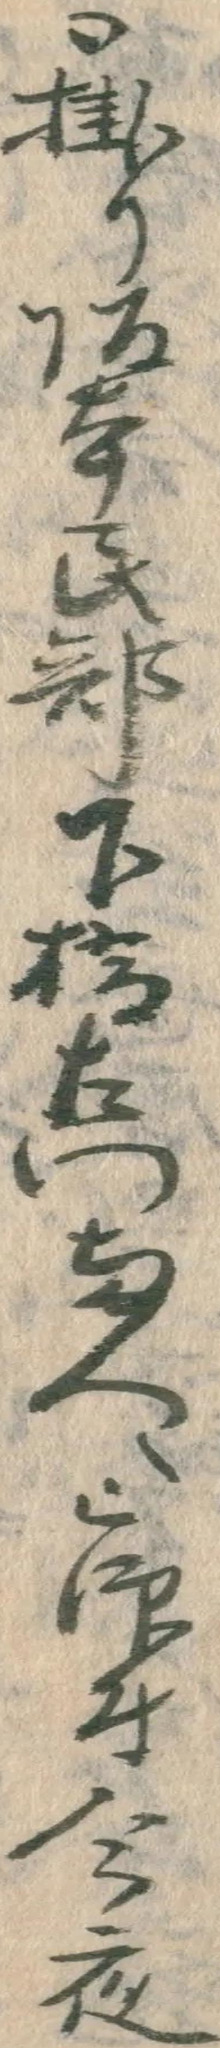御掛り坂本民部・下橋左門両人へ被仰付、今夜
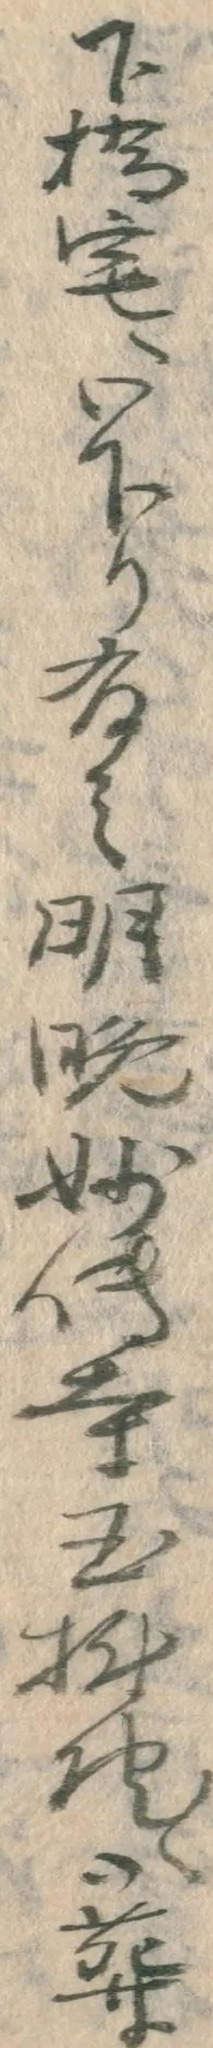下橋宅へ御下り有之、明晩妙傳寺玉料院へ御葬
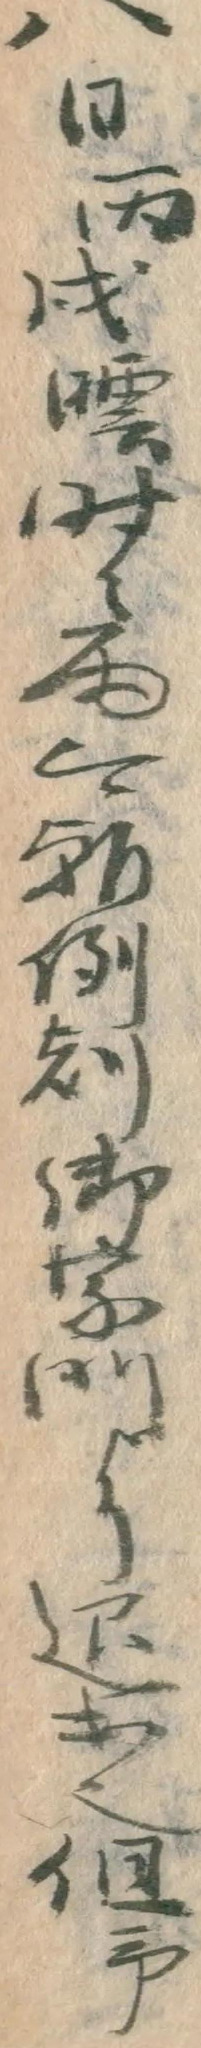八日丙戌晴時〻雨、今朝例刻御家門より退出也、但予

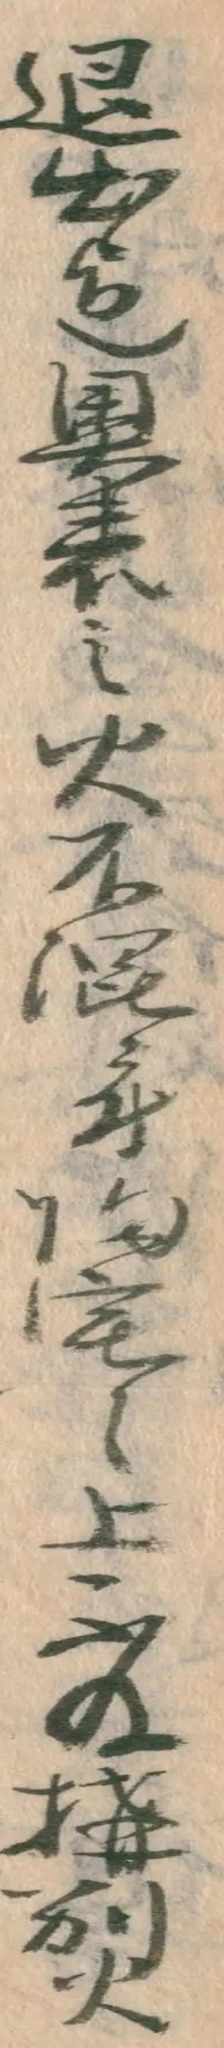退出迄奥表之火不混ニ付帰宅之上、不及構別火
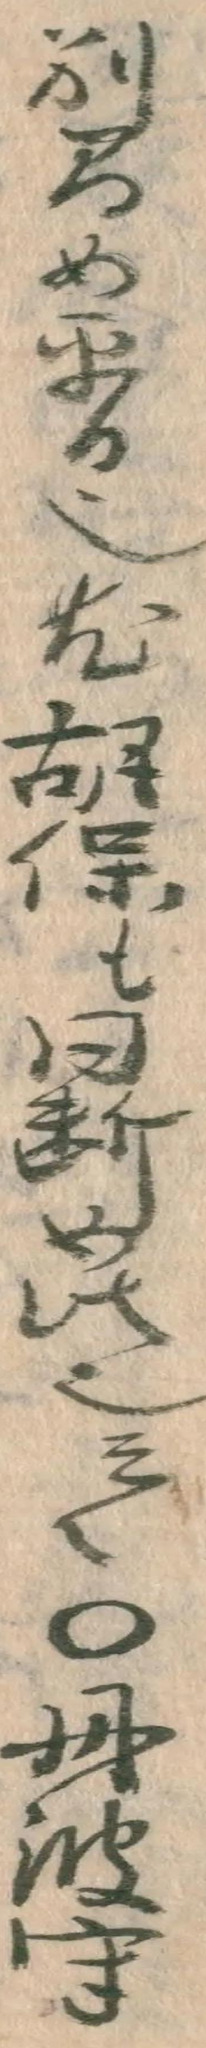別間如平日也、尤胡保も同断如此也云々、〇丹波守
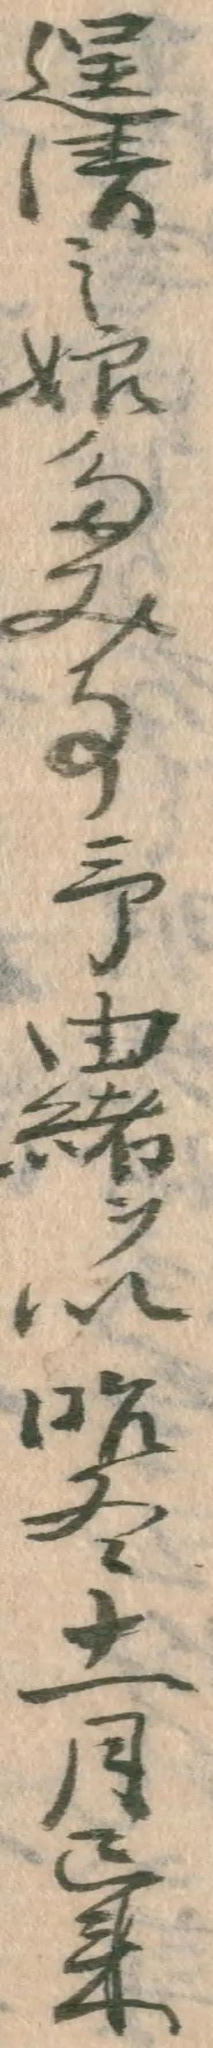逞清之娘たみ事、予由緒を以昨冬十一月巳来
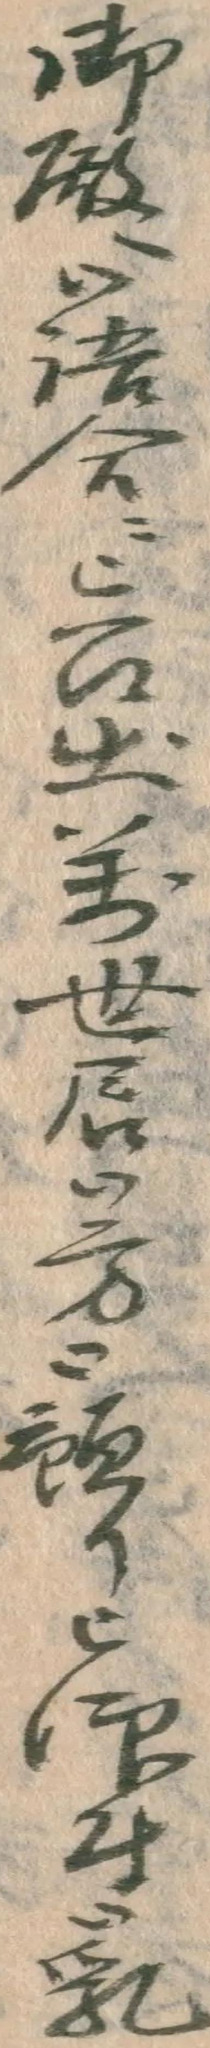御殿へ御詰合に被召出萬世君の方御預り被仰付御乳
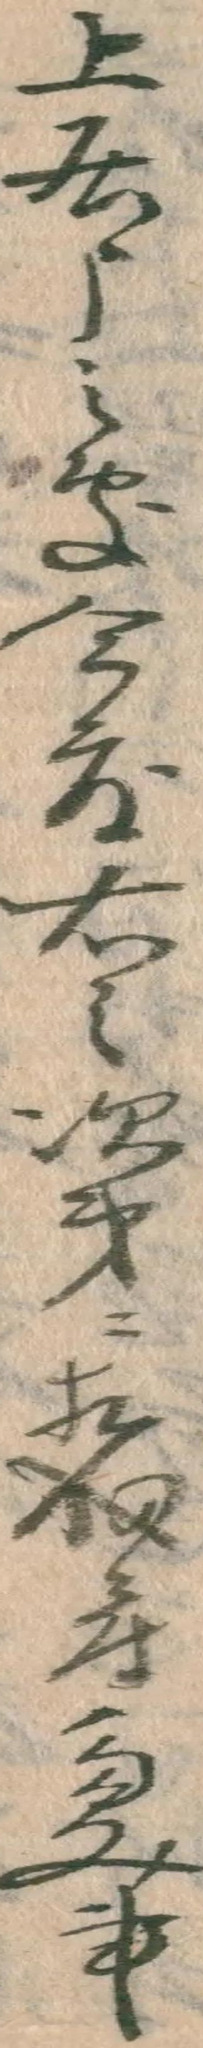上居申候處、今度右之次第ニ相成ニ付、たみ事
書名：賀茂社記録. 第63冊
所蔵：国立国会図書館 National Diet Library, JAPAN
